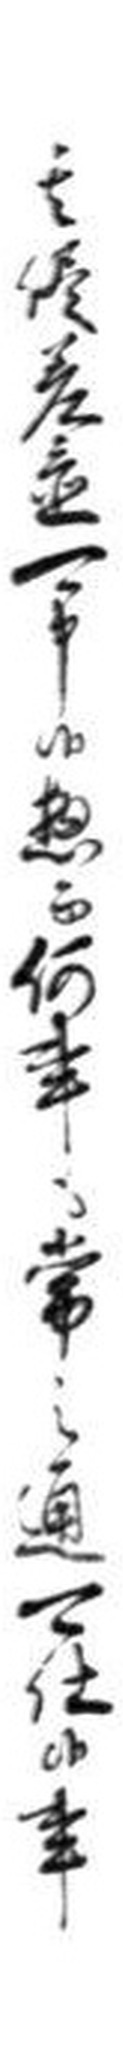其儘差置可申候惣而何事も常之通可仕候事
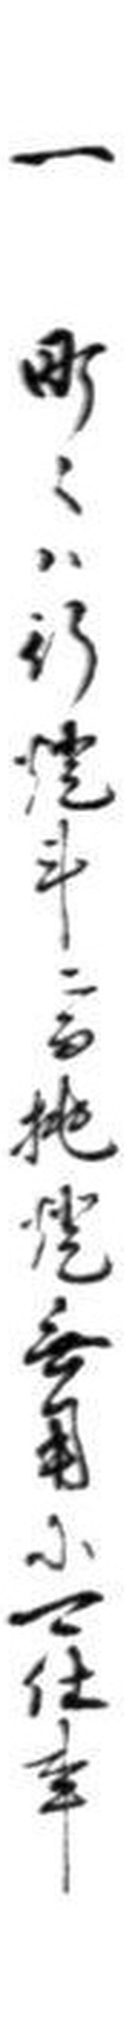一町々ハ行燈斗ニ而挑燈無用に可仕事
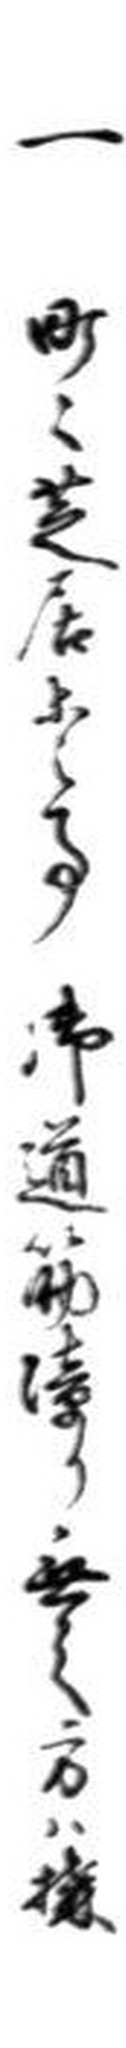一町々芝居等之事御道筋障り無之方ハ構
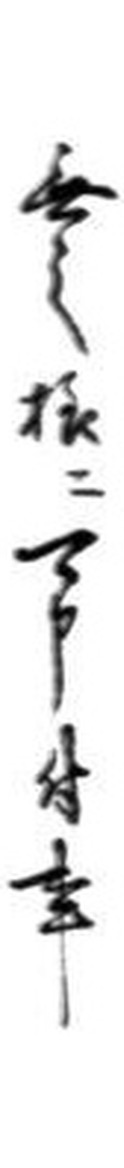無之様ニ可申付事
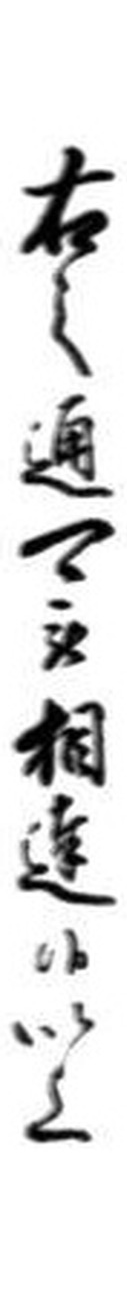右之通可被相達候以上
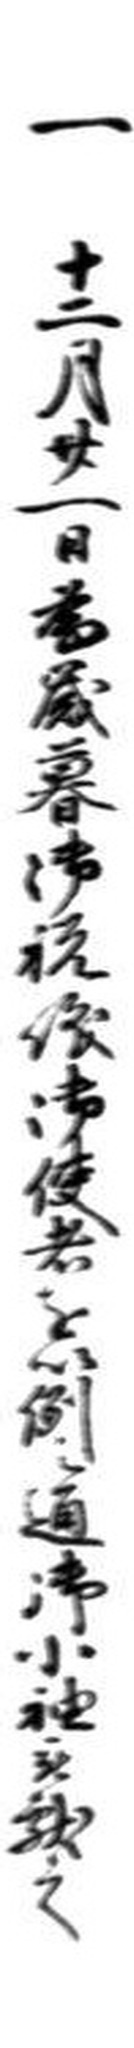一十二月廿一日為歳暮御祝儀御使者を以例之通御小袖被献之
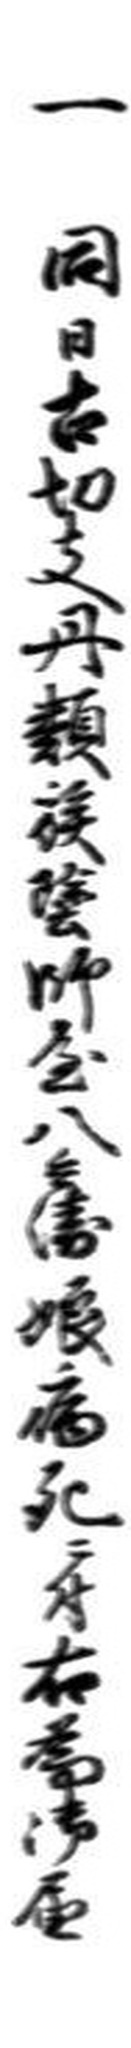一同日古切支丹類族塗師屋八兵衛娘病死ニ付右為御届
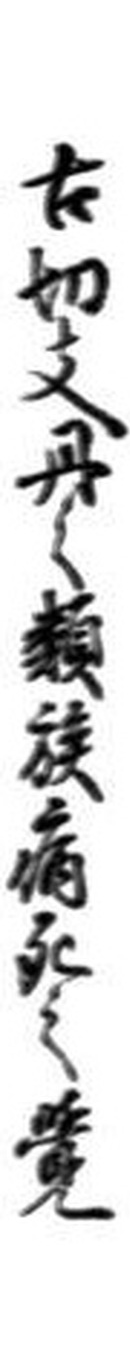古切支丹之類族病死之覚
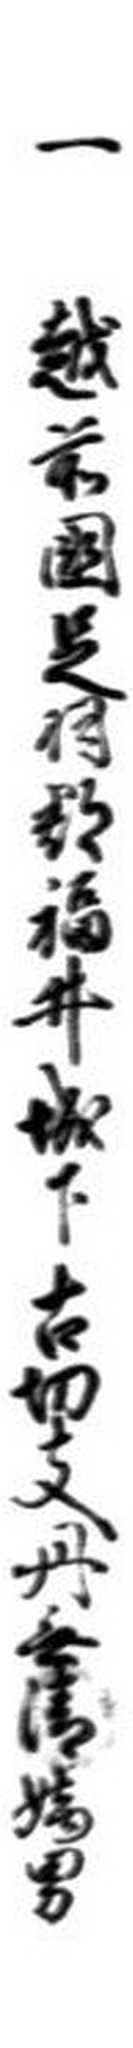一越前国足羽郡福井城下古切支丹無清嫡男
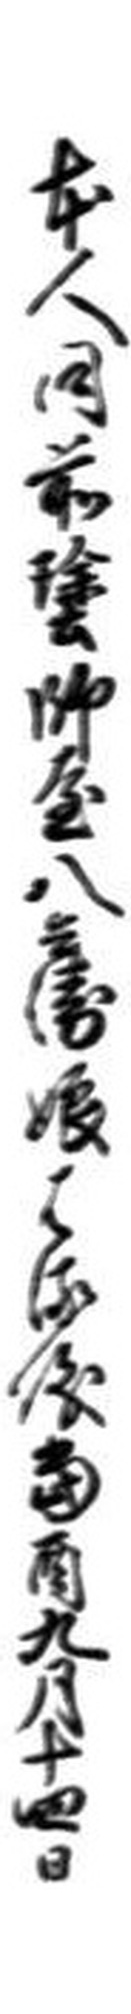本人同前塗師屋八兵衛娘はる儀当酉九月十四日
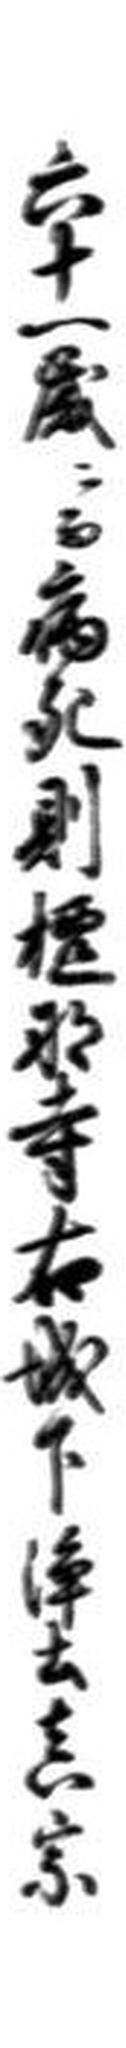六十一歳ニ而病死則檀那寺右城下浄土真宗
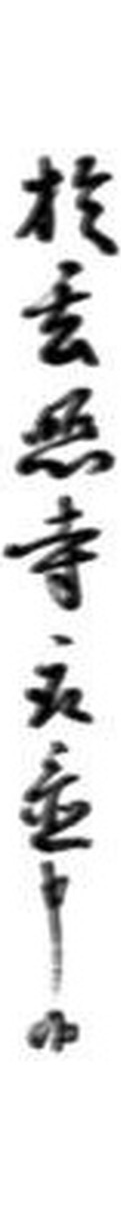於玄照寺取置申候

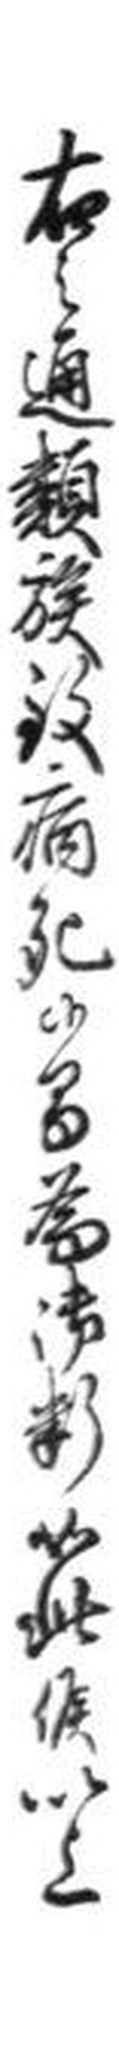右之通類族致病死候間御断如此候以上
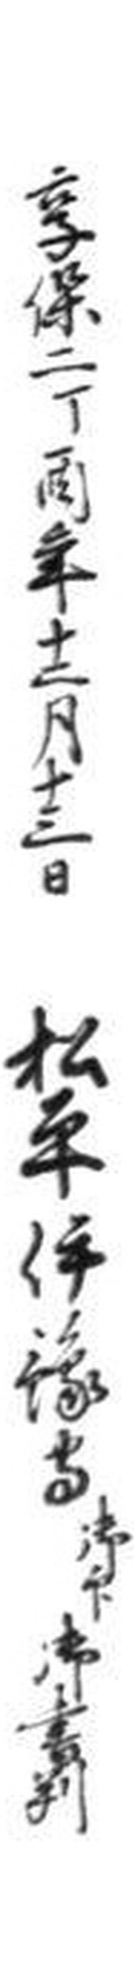享保二丁酉年十二月十三日松平伊予守御印御書判
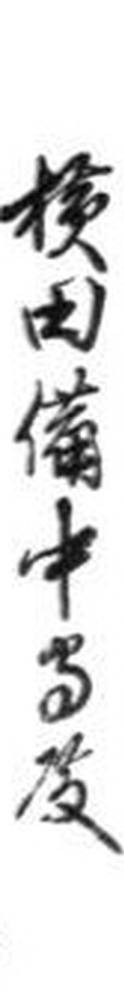横田備中守殿
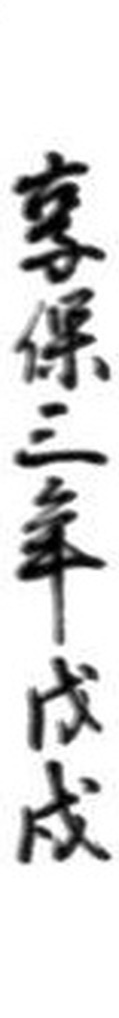享保三年戊戌
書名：家譜 三十二 吉邦公 従享保二年到享保三年
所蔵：福井県文書館 Fukui Prefectural Archives
